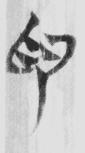色
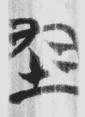均
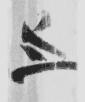之
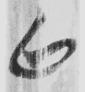㠯（以）
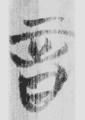音
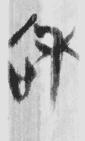和
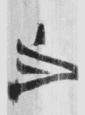之
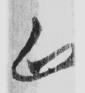㠯（以）
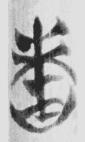昧
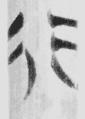行
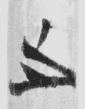之
